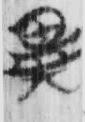異
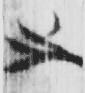之
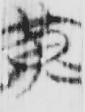黃
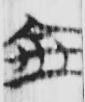金
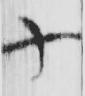七
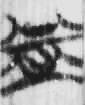益
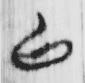㠯（以）
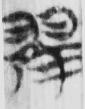翟（糴）
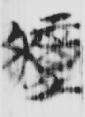穜（種）
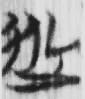迄
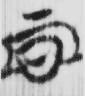○（期）
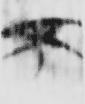不
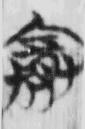賽
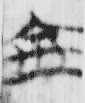金
